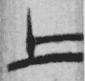上
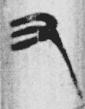又（有）
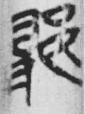○（燕）
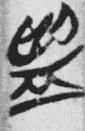監（銜）
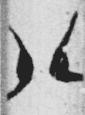卵
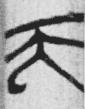而
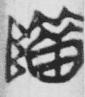○（措）
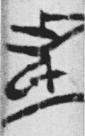者（諸）
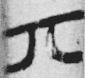亓（其）
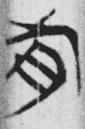前
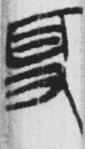取
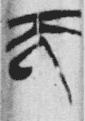而
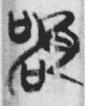○（吞）
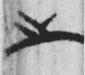之
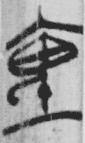○（娠）
